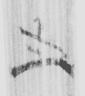之
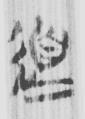道
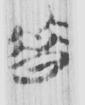昔
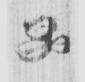晶
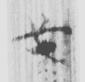弋
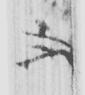之
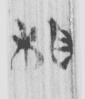相
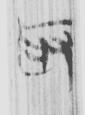取
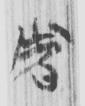周
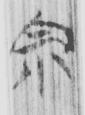宗
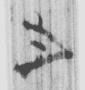之
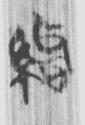紿
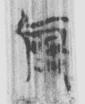庳
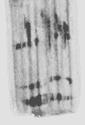{卅二}
